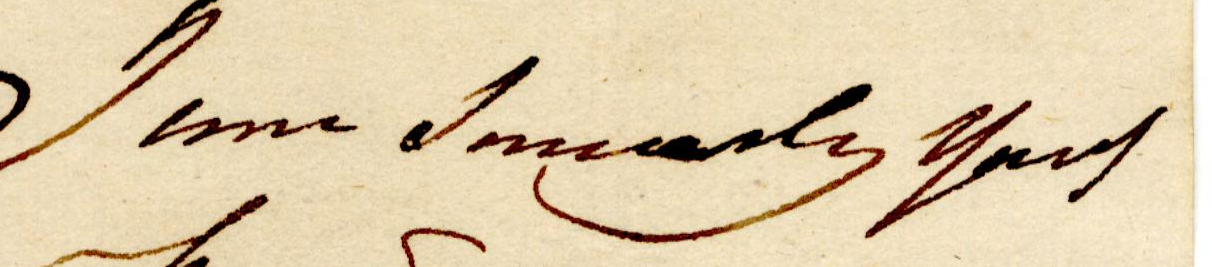I am Sincerly Yours
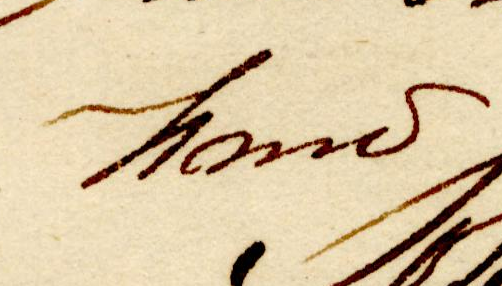honord
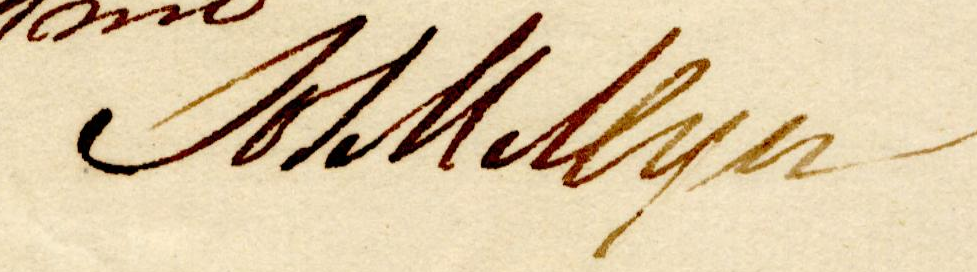Sol M Myers
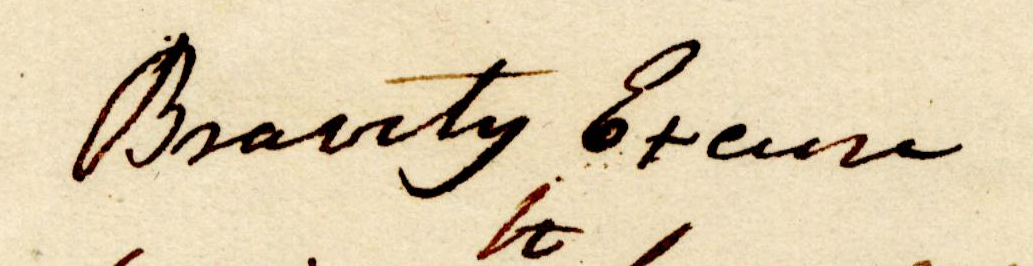Bravety Excuse
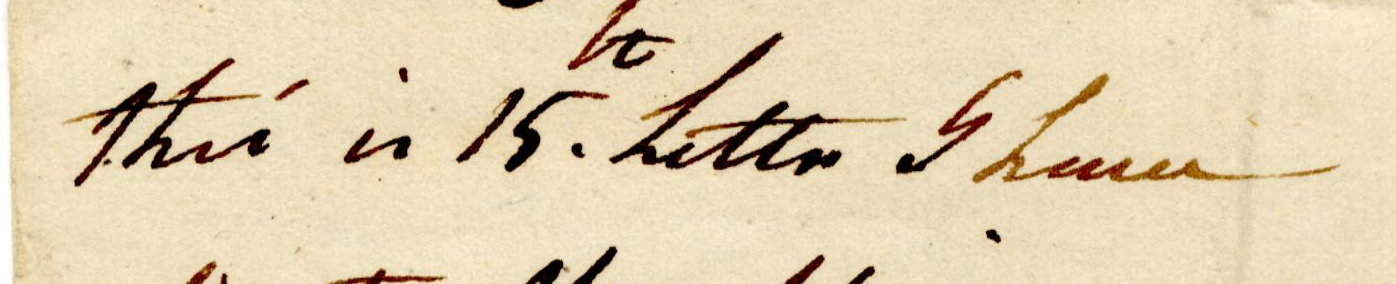this is 15^th. letter I have
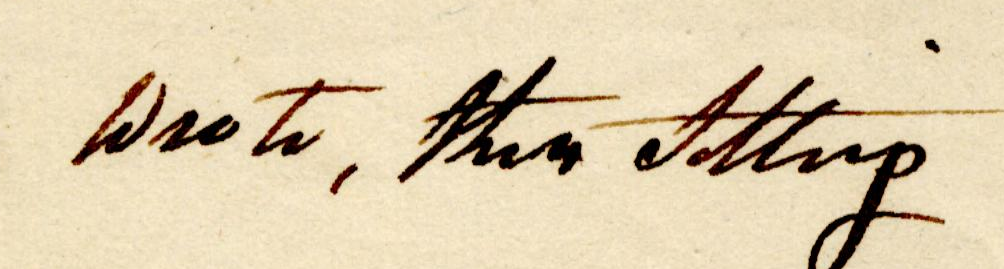wrote, this Sitting
